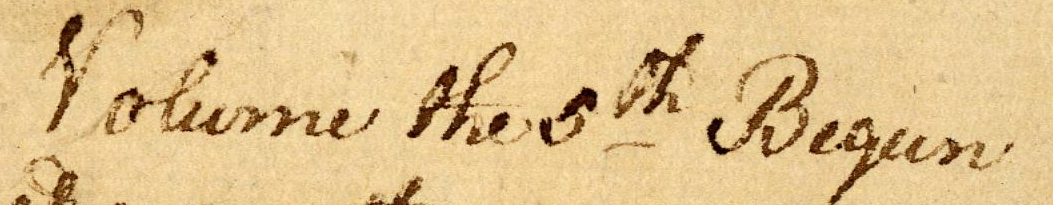Volume the 5^th Begun
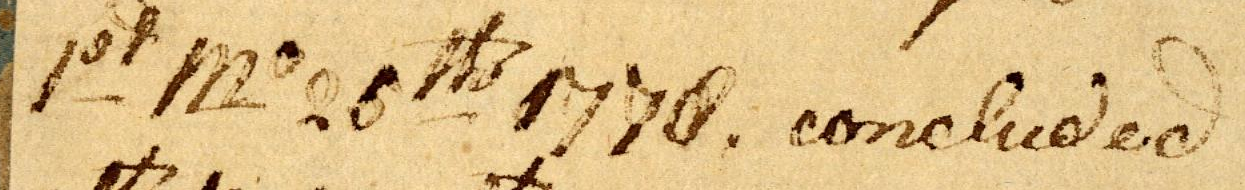1^st M^o 8^th 1778. concluded
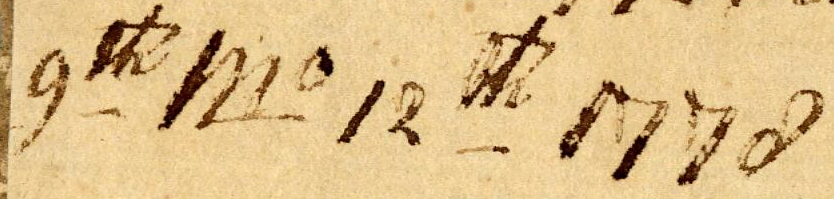9^th M^o 12^th 1778
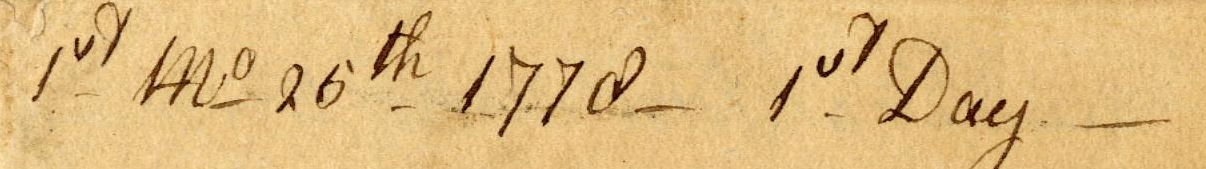7^th M^o 20^th 1778- 1^st Day
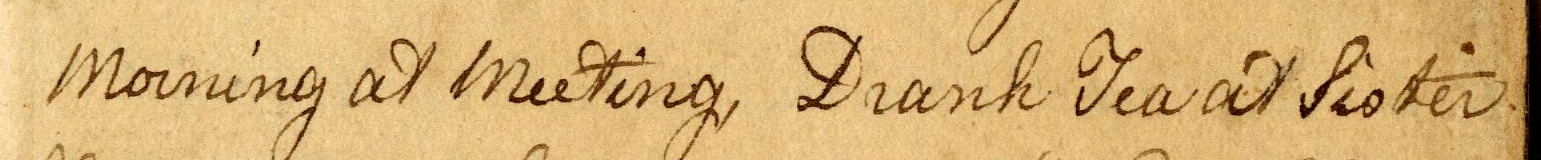Morning at Meeting, Drank Tea at Sister
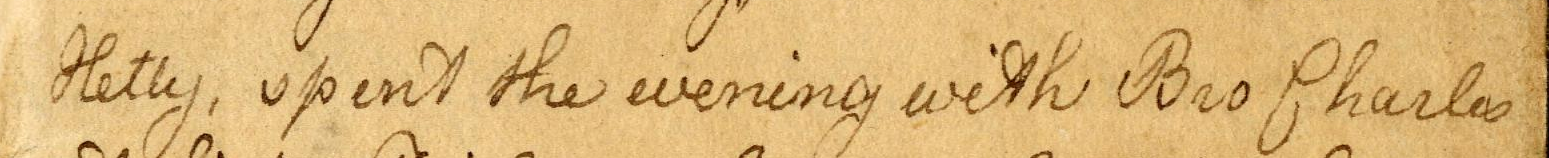Hetty, spent the evening with Bro Charles
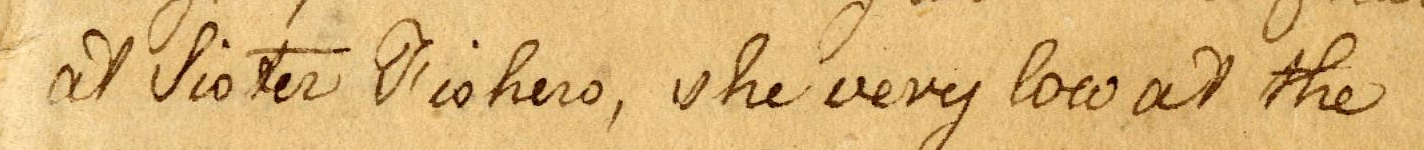at Sister Fishers, she very low at the
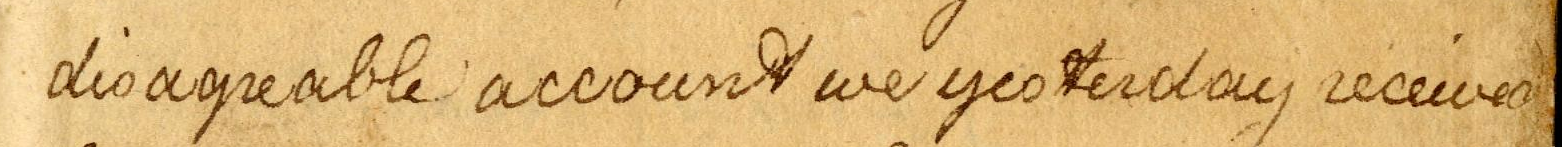disagreable account we yesterday receives
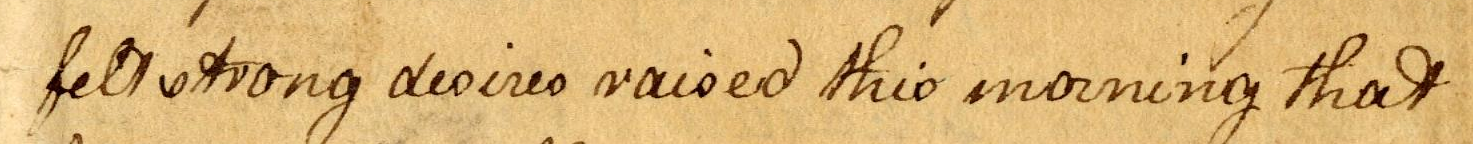felt strong desires raised this morning that
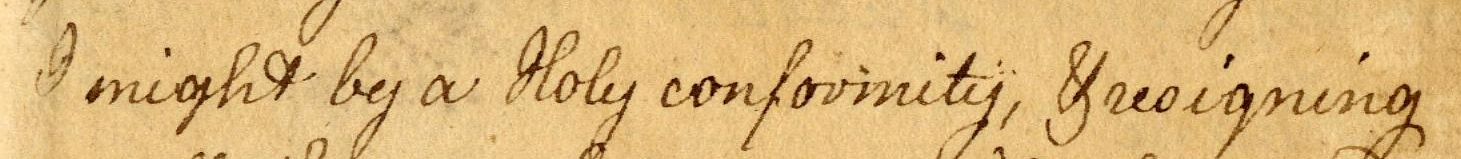I might by a Holy conformity, & resigning
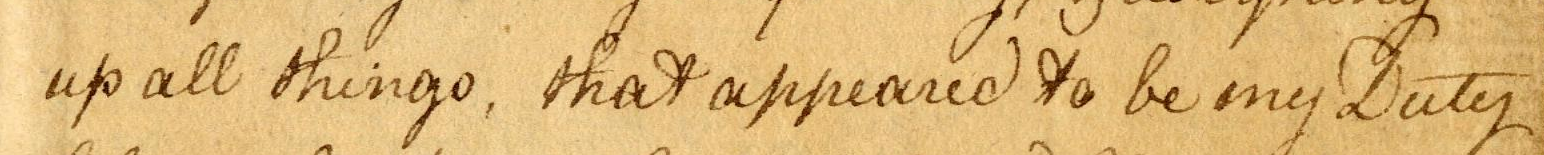up all things, that appeared to be my Duty
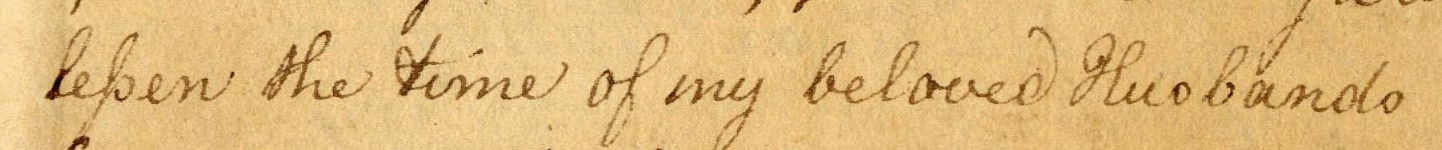lessen the time of my beloved Husbands
